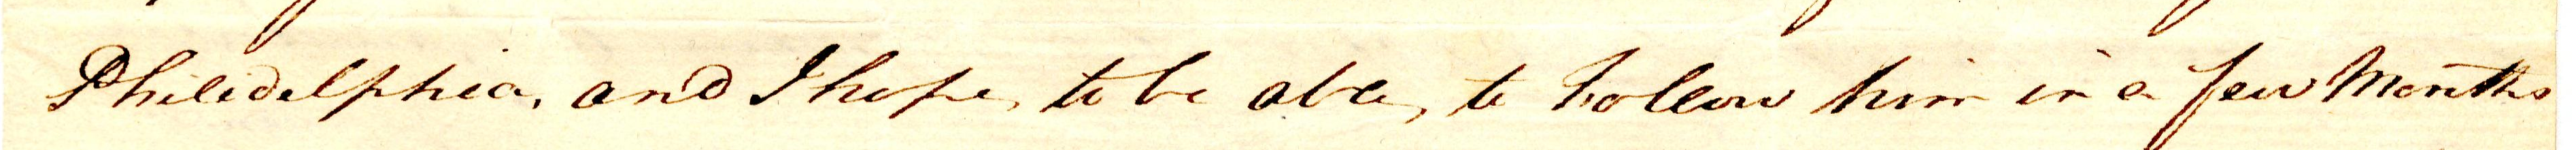Philadelphia, and I hope to be able to follow him in a few Months
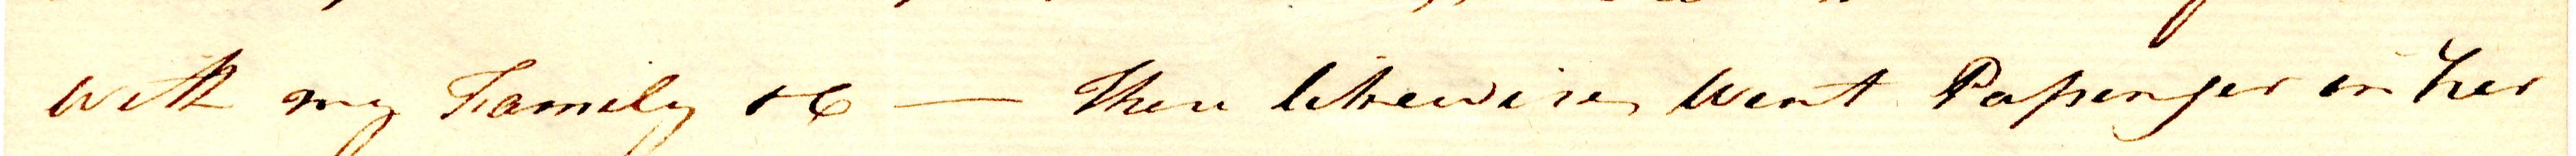with my Family &c- There likewise went Passenger in her
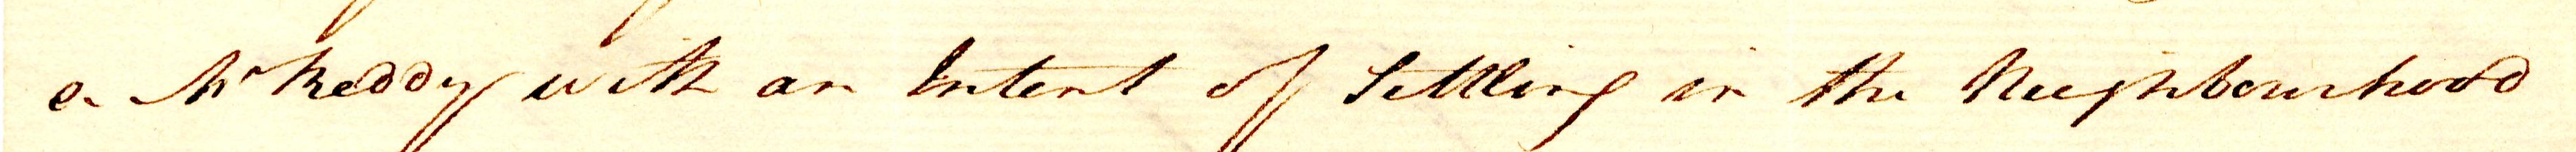& M^r Reddy with an Intent of settling in the Neighbourhood
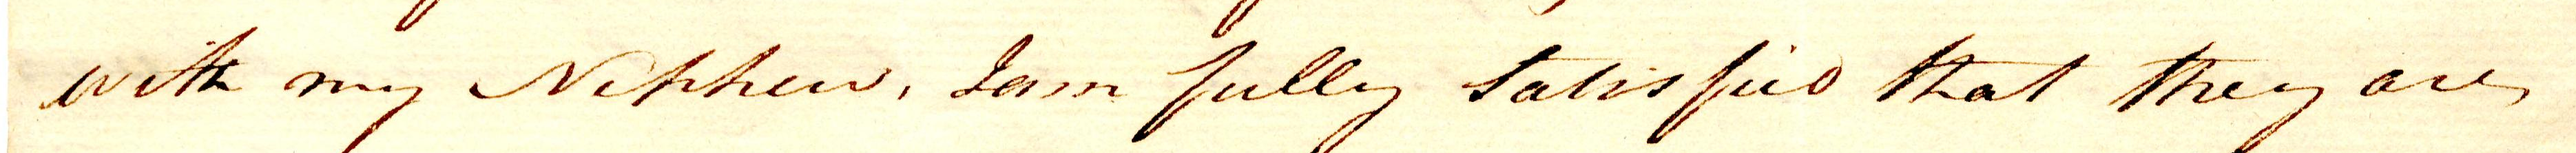with my Nephew. I am fully satisfied that they are
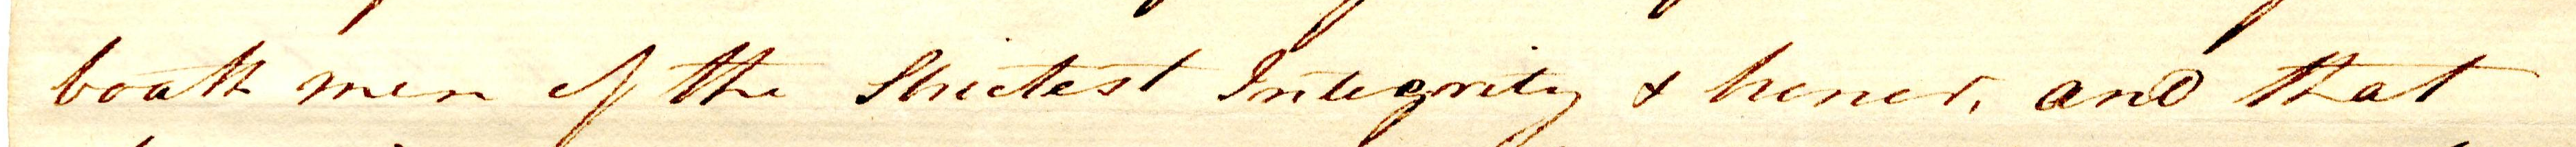boath men of hte strictest Integrity & honor, and that
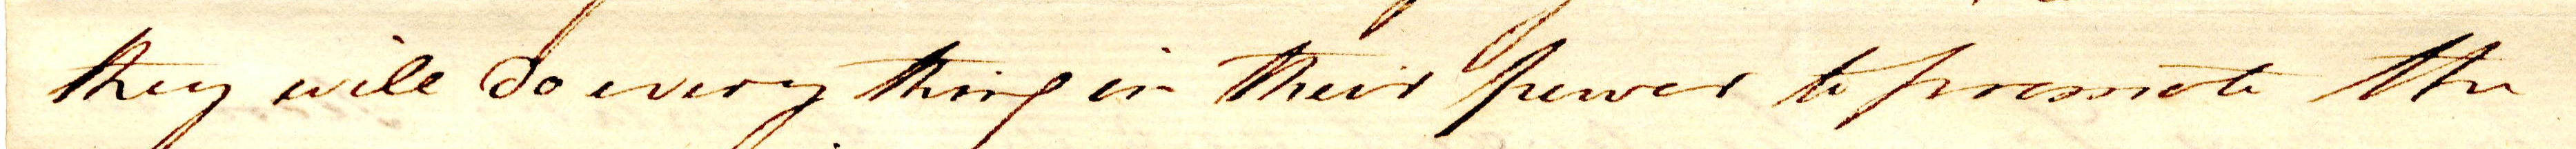they will do every thing in their power to promote the
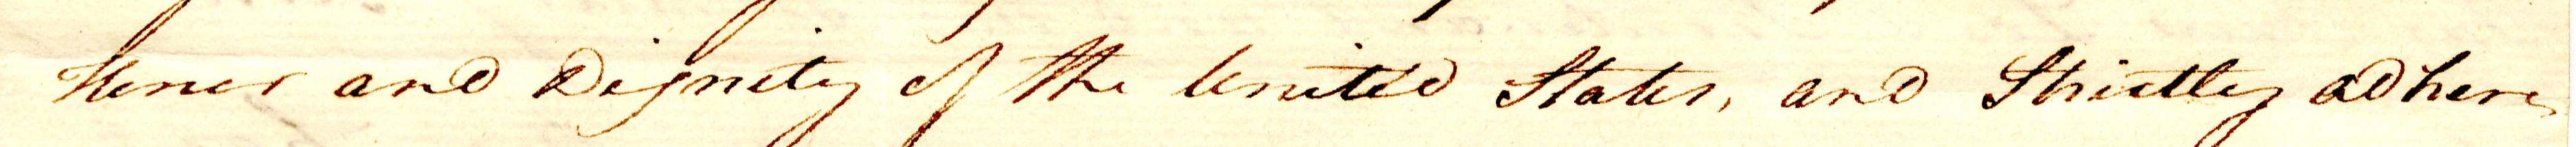Honor and Dignity of the United States, and strictly adhere
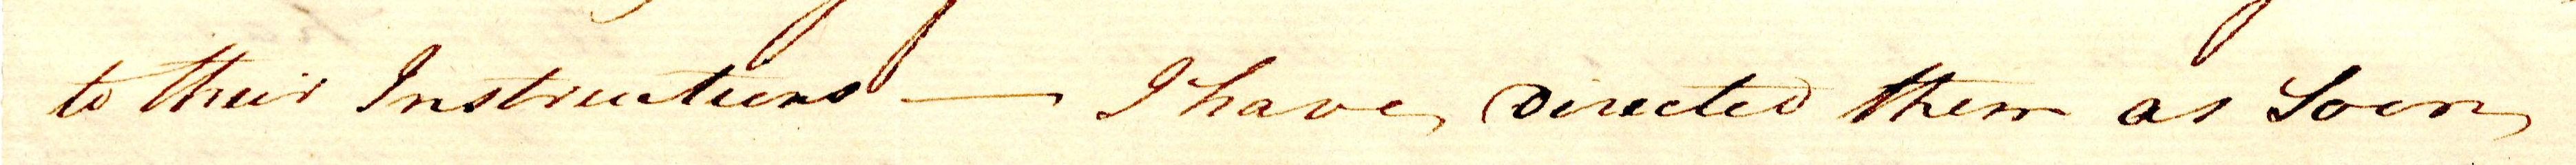to their Instructions- I have directed them as soon
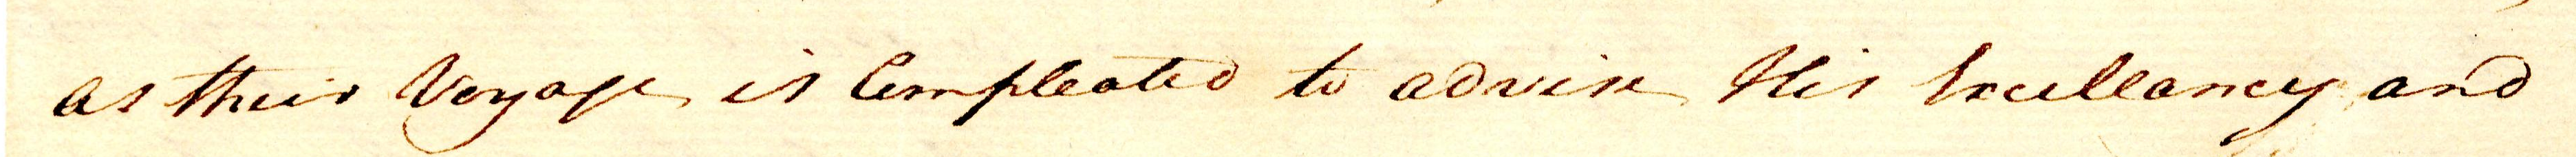as their Voyage is Compleated to advise His Excellancy and
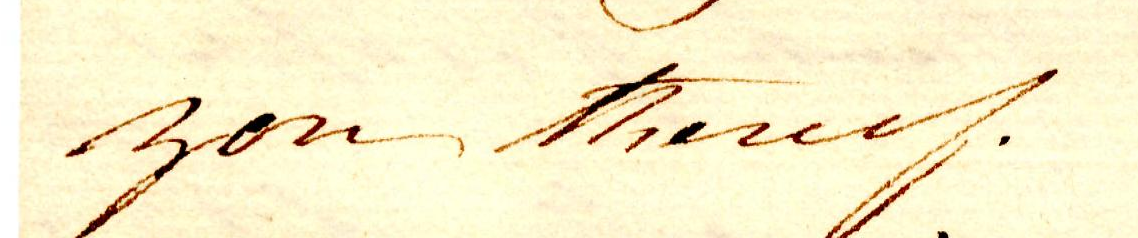you thereof.
